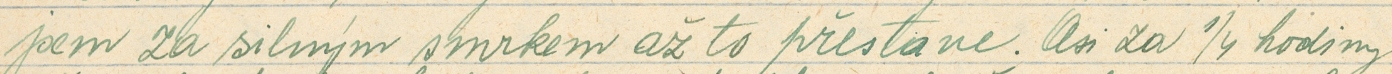jsem za silným smrkem až to přestane. Asi za 1/4 hodiny
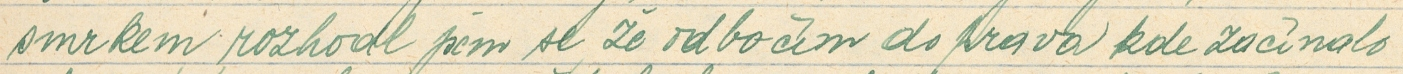smrkem rozhodl jsem se že odbočím doprava kde začínalo
